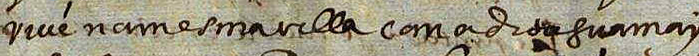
viuē na mesma villa com a dita sua may
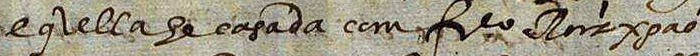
e q̄ ella he casada com Fr.co Roiz̄ xpaõ
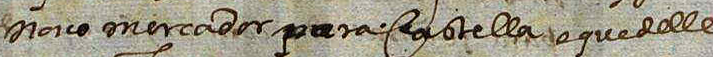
nouo mercador para. Castella e que delle
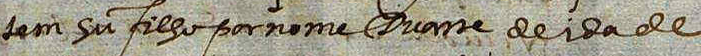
tem hū filho por nome Duarte de idade
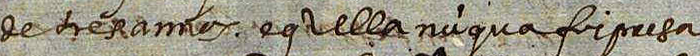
de tres annos. e q̄ ella nūqua foi presa
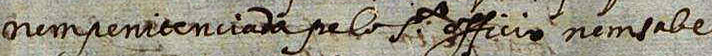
nem penitenciada pelo S.to officio nem sabe
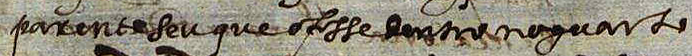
parente seu que o fosse dentro no quarto
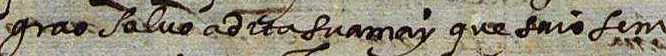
grao saluo a dita sua may que saio sem
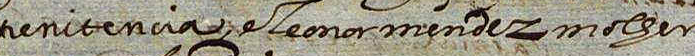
penitencia, e Leonor mendez molher
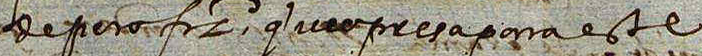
de pero frz̄, q̄ ueo presa para este
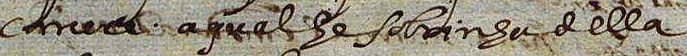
carcere. a qual he sobrinha della
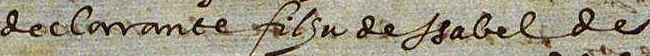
declarante filha de Jsabel de
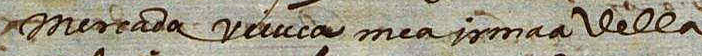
mercada viuua mea irmaã della
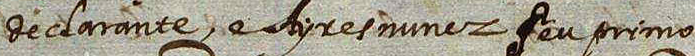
declarante, e Ayres nunez seu primo
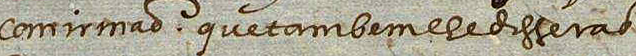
com irmaõ. que tambem lhe disseraõ
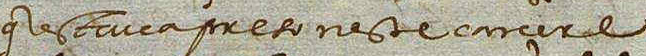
q̄ estaua preso neste carcere
